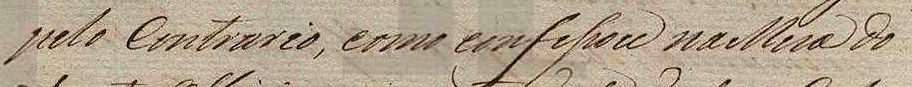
pelo Contrario, como confessou na Meza do
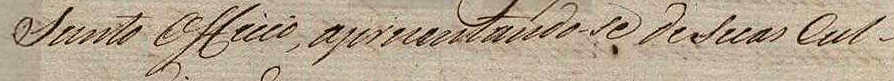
Santo Officio, aprezentando-se de suas cul
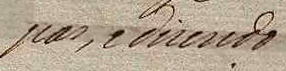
pas, e dizendo
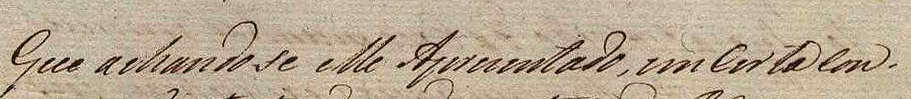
Que achandose elle Aprezentado, em certa con
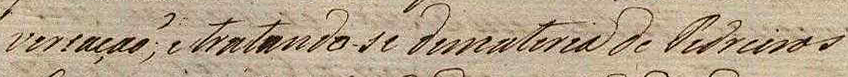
versaçaõ, e tratando-se de materia de Pedreiros
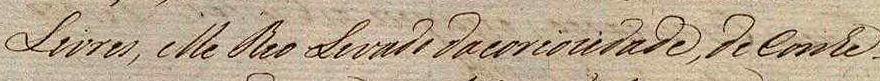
Livres, elle Reo Levado da coriozidade, de Conhe
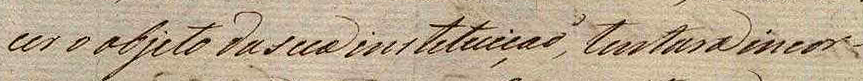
cer o objeto da sua instetuiçaõ, tentara incor
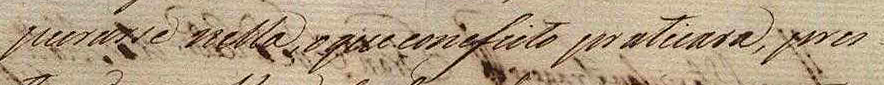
purarse nella, o que com efeito praticara, pres
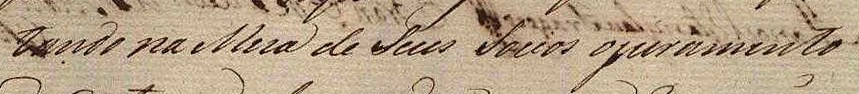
tando na Meza de Seus Socios o juramento
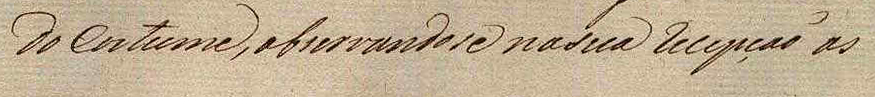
do costume, observando-se na sua Recepçaõ as
